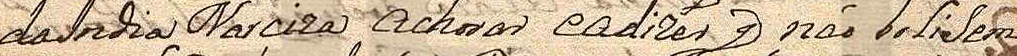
da India Narçiza a chorar e a dizer q̄ naõ bolisem
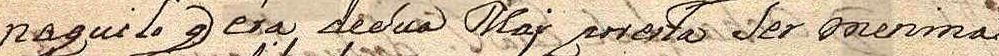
naquilo q̄ era de sua May por esta ser menina
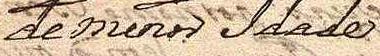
de menor Idade
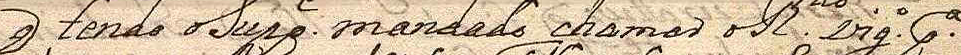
q̄ tendo o Supp.e mandado chamar o R.do vig.o p.a
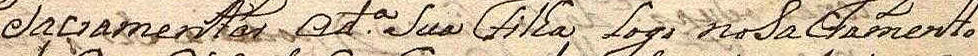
sacramentar a d.ta sua Filha logo no Sacramento
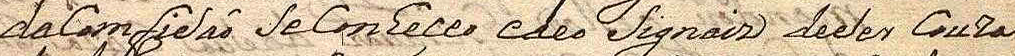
da Comfisaõ se Conheçeo e deo Signaiz de ser couza
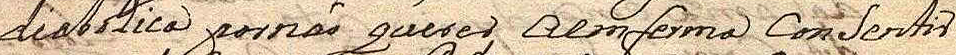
diabolica por naõ querer a emferma conSentir
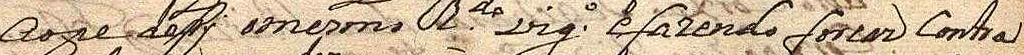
ao pe de sy o mesmo R.do vig.o e fazendo forcaz contra
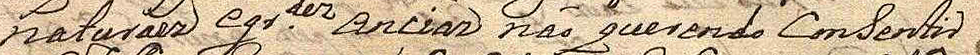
naturaez e gr.dez ançiaz naõ querendo conSentir
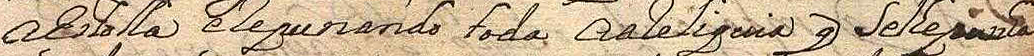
a Estolla e Repunando toda a aReliquia q̄ se lhe punha
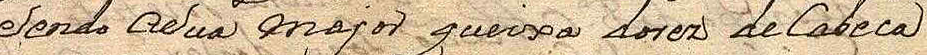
sendo a sua major queixa dorez de Cabeca
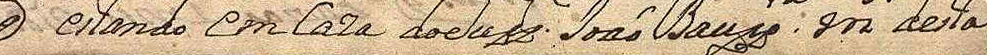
q̄ estando em Caza do supp.te Ioaõ Baupp.ta mor desta
